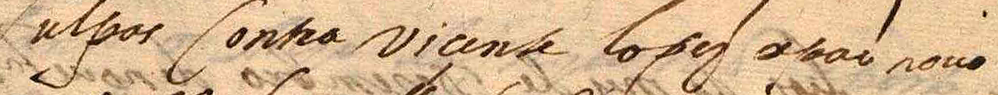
Culpas Contra viçente lopez xpaõ nouo
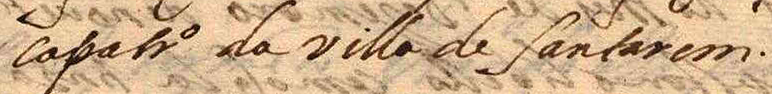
capatro da villa de Santarem.
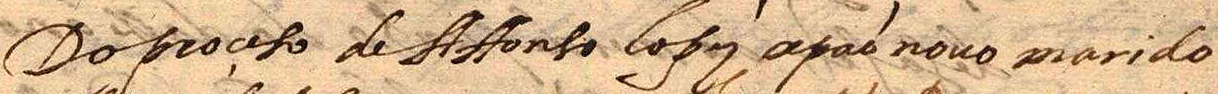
Do proçeso de Affonso lopez xpaõ nouo marido
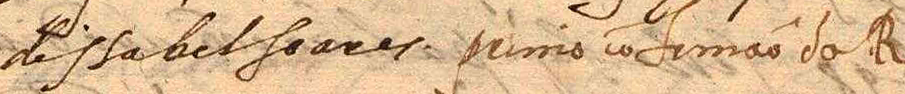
de Jsabel soares primo cōIrmaõ do .R.
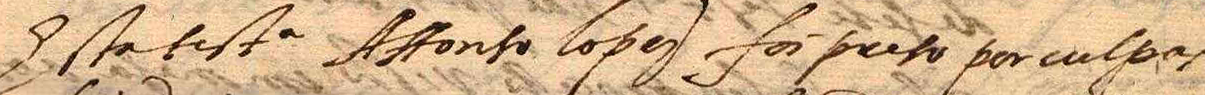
Esta testa Affonso lopez foi preso por culpas
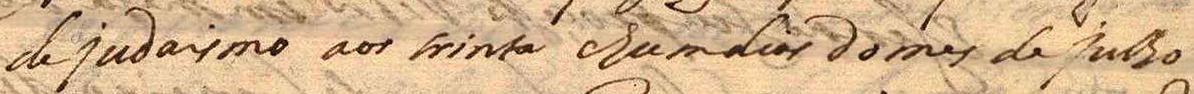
de Judaismo aos trinta e hum dias do mes de Julho
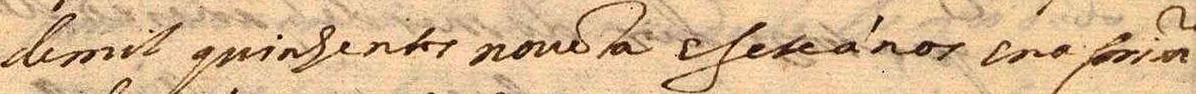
de mil quinhentos nouēta E sete ānos E na primra
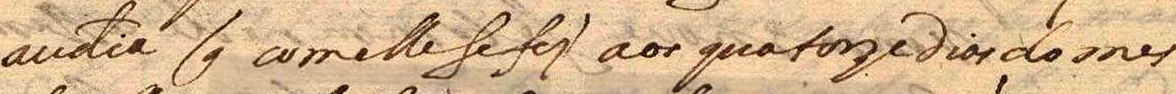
aud̄ia q̄ com elle se fez aos quatorze dias do mes
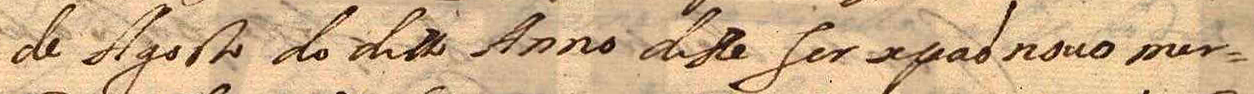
de Agosto do ditto Anno disse ser xpaõ nouo mer
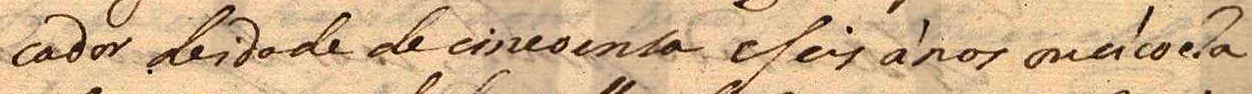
cador de idade de cincoenta E seis ānos ou cīcoēta
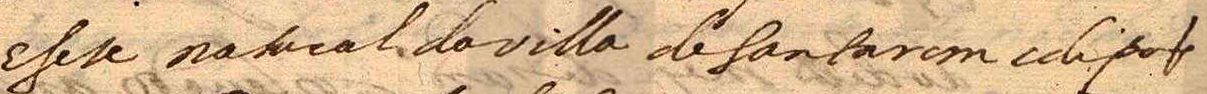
E sete natural da villa de santarem e dipos
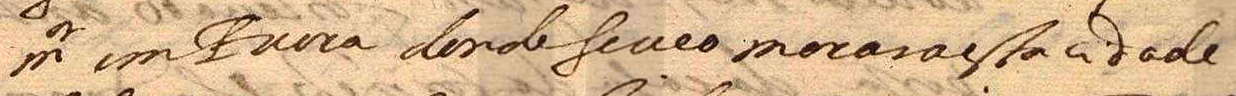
msor em Euora donde se ueo morar a esta cidade
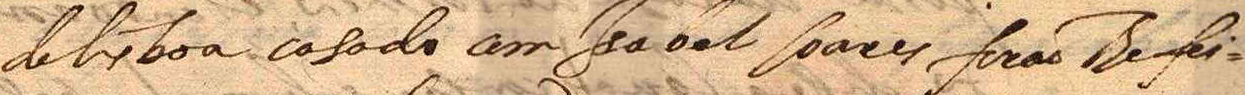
de lisboa casado com Jsabel soares foraõ lhe fei
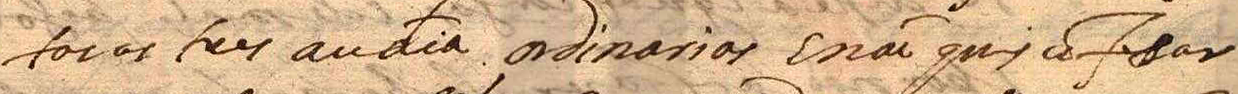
tas as tres audīa ordinarias E naõ quis cōfessar
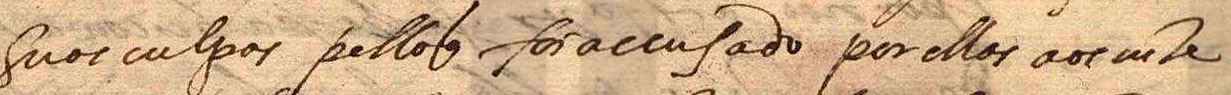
suas culpas pello q̄ foi accusado por ellas aos uīte
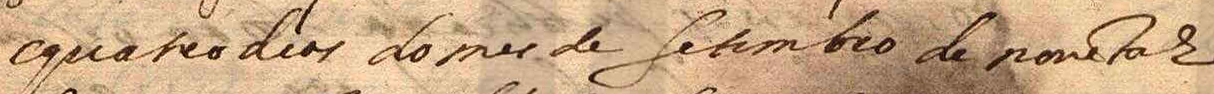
e quatro dias do mes de Setembro de nouēta E
